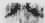八
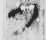月
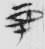辛
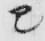巳
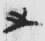之
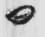日
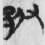○（付）
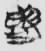○（舉）
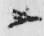之
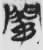○（關）
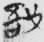○（敔）
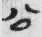公
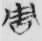周
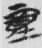童
